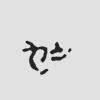{叴欠}
